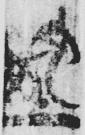○（地）
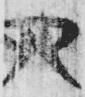四
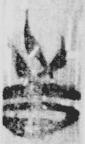○（時）
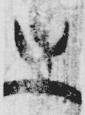之
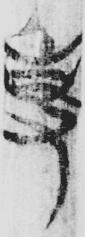事
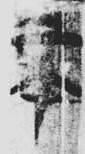不
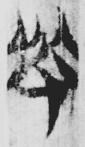攸（修）
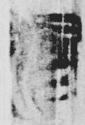湯
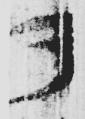乃
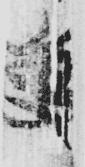尃
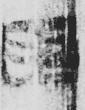爲
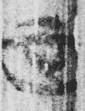正（征）
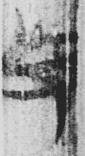○（籍）
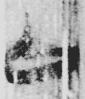㠯（以）
